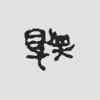翼
